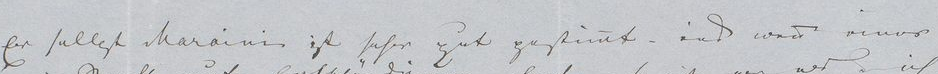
Er selbst Maraini ist sehr gut gestimmt, und wenn einer
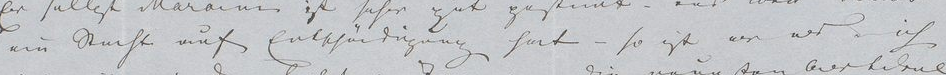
ein Recht auf Entschädigung hat, so ist er es, ich
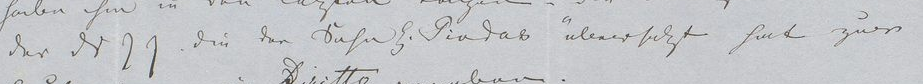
der NZZ die der Sohn H. Piodas übersetzt hat zur
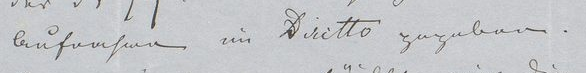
Aufnahme im Diritto gegeben.
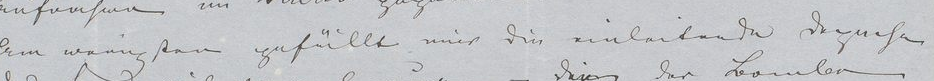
Am wenigsten gefällt mir die einleitende Depeche
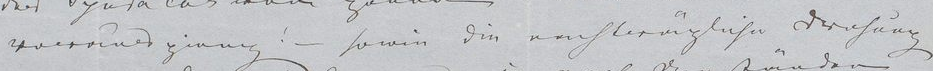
voraus gieng!– sowie die nachträgliche Drohung
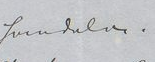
handeln.
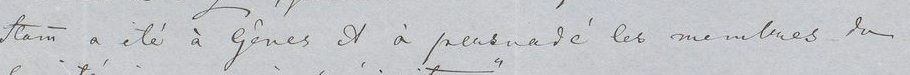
«Stamm a eté à Gênes et à persuadé les membres du
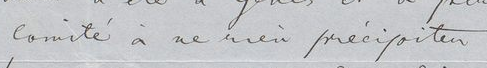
Comité à ne rien précipiter»
